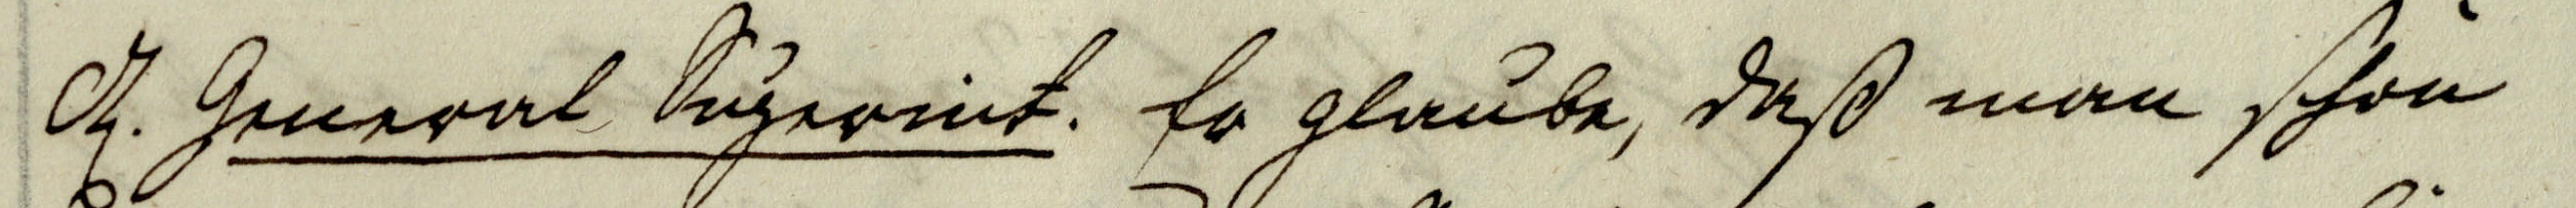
dh. General Superint. Er glaube, daß man schon
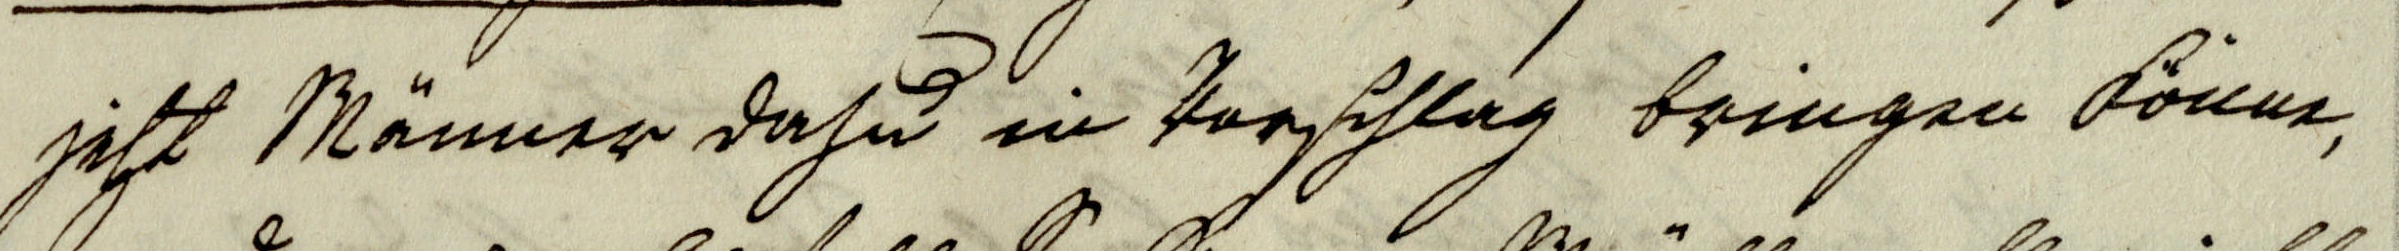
jetzt Männer dazu in Vorschlag bringen könne,
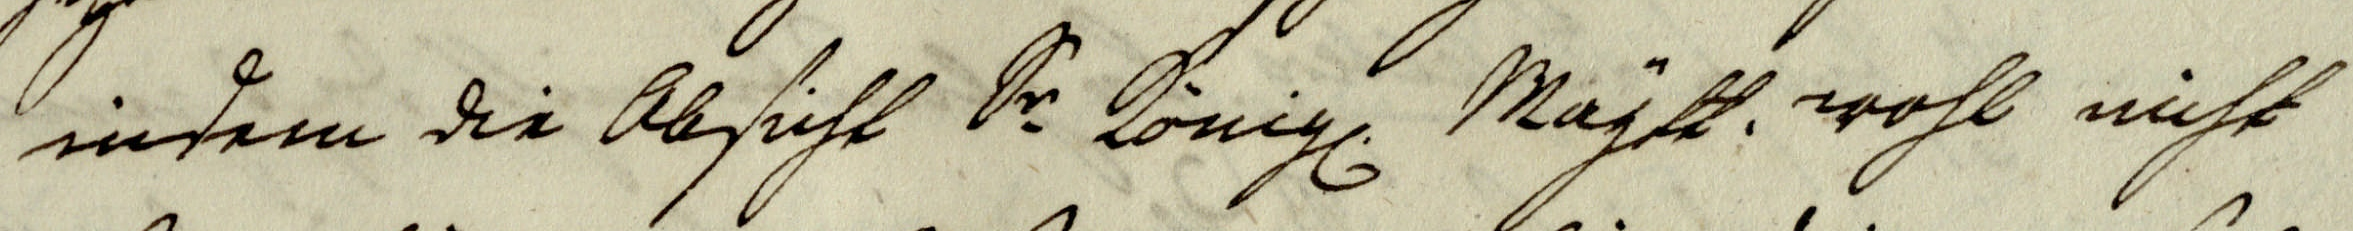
indem die Absicht Sr. Königl. Maÿst. wohl nicht
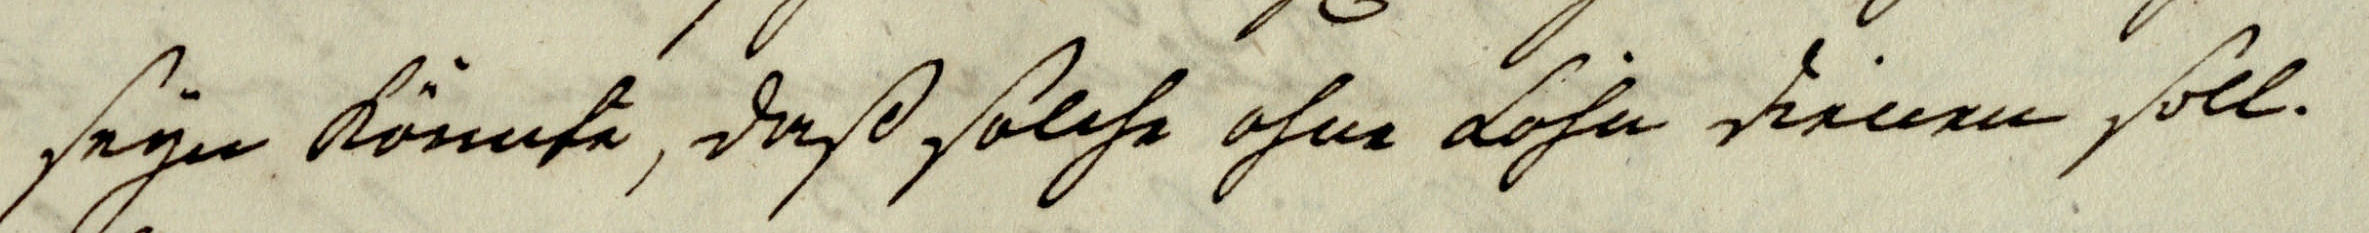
seÿn könnte, daß solche ohne Lohn dienen soll¬
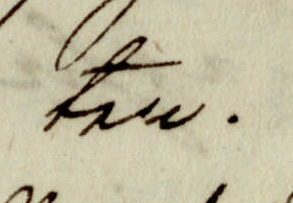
ten.
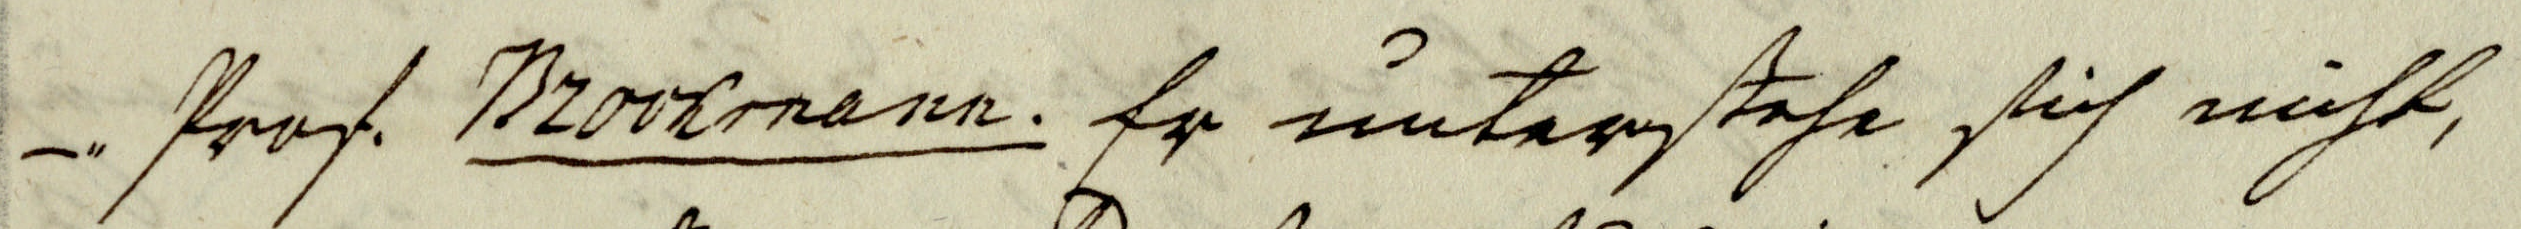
— " Prof. Brockmann. Er unterstehe sich nicht,
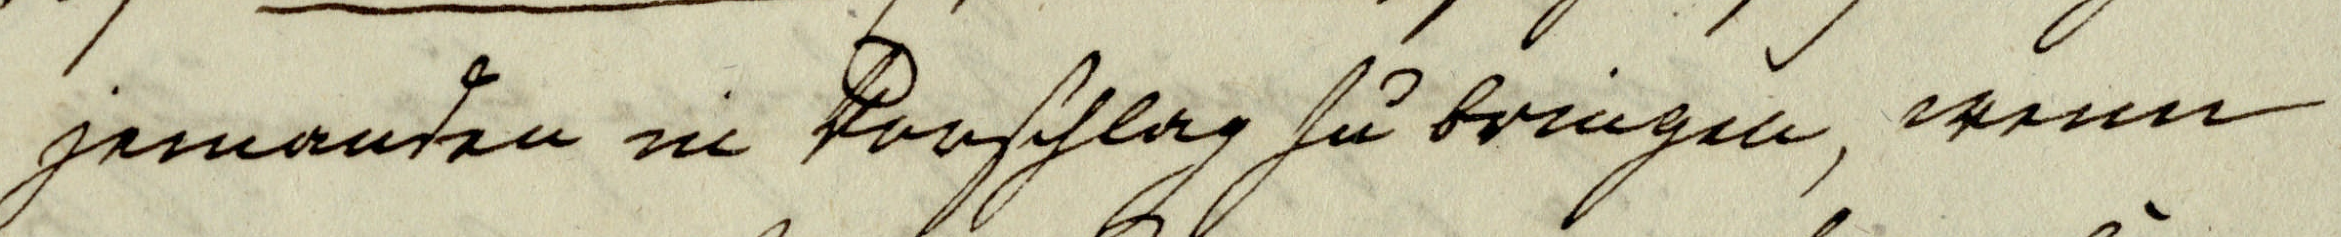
jemanden in Vorschlag zu bringen, wenn
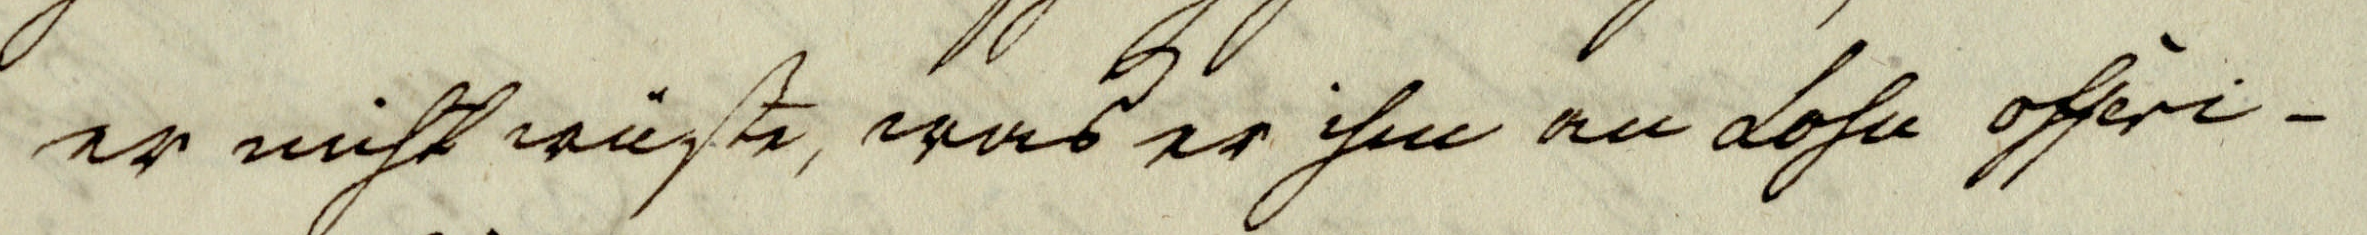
er nicht wüsste, was er ihm an Lohn offeri¬
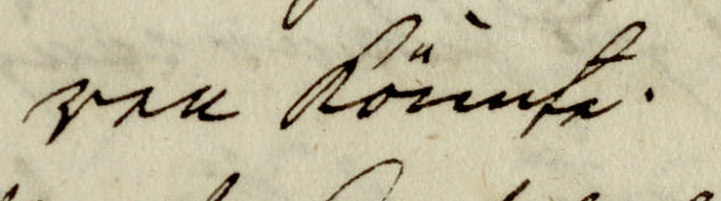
ren könnte.
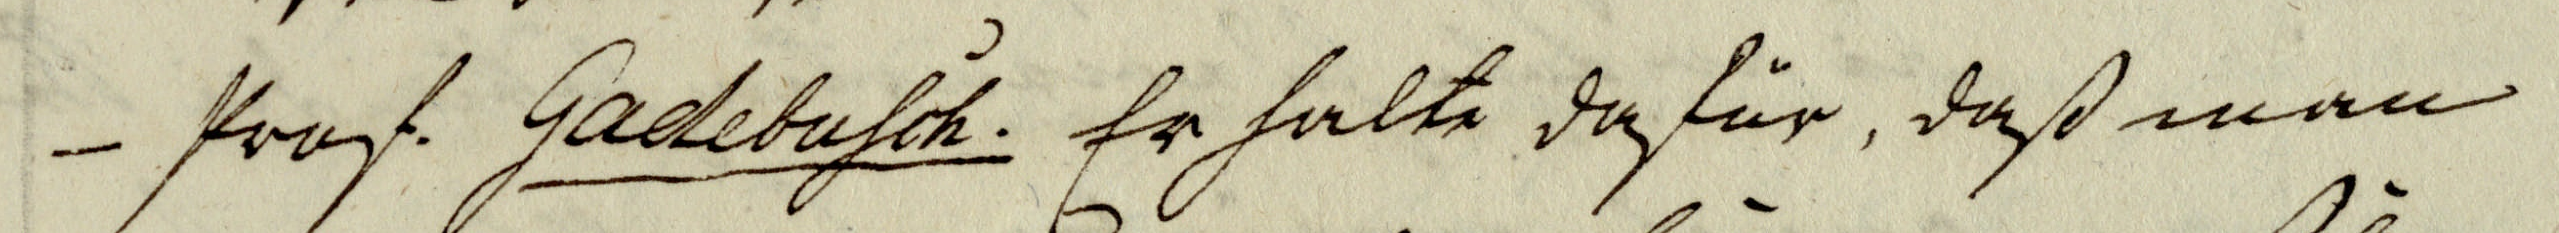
— Prof. Gadebusch. Er halte dafür, daß man
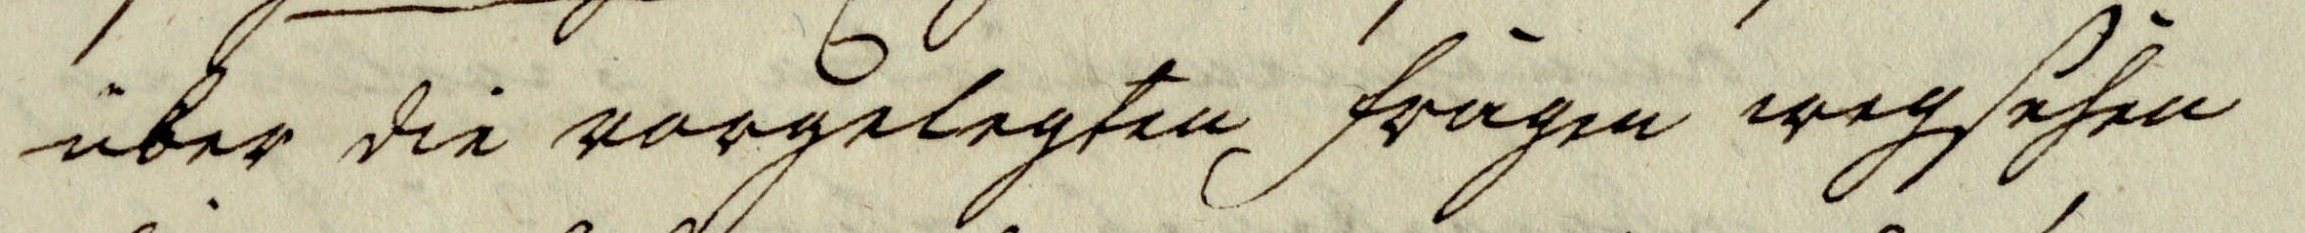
über die vorgelegten Fragen wegsehen
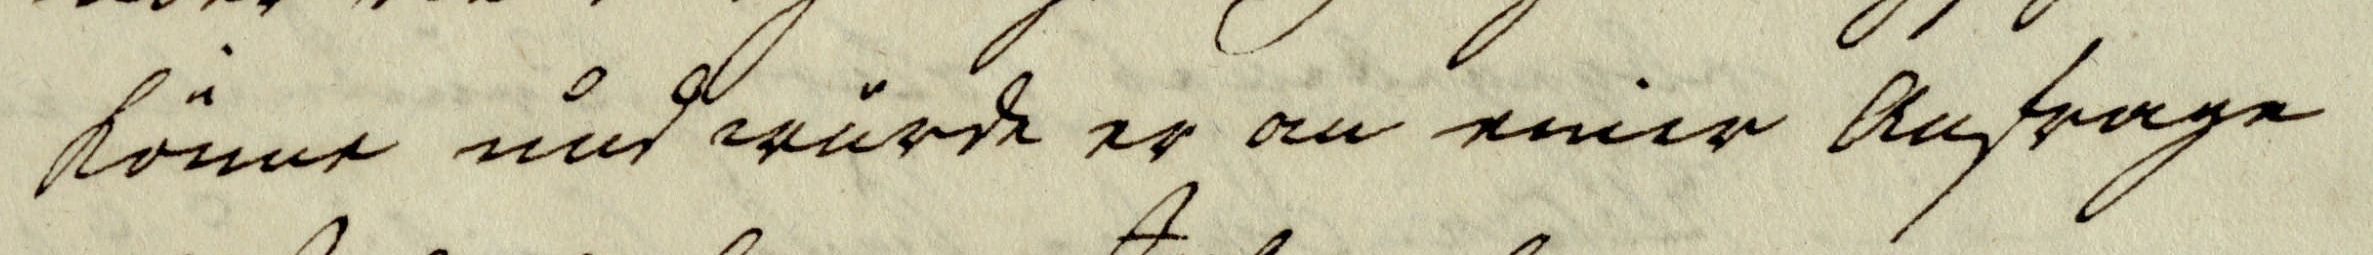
könne und würde er an einer Anfrage
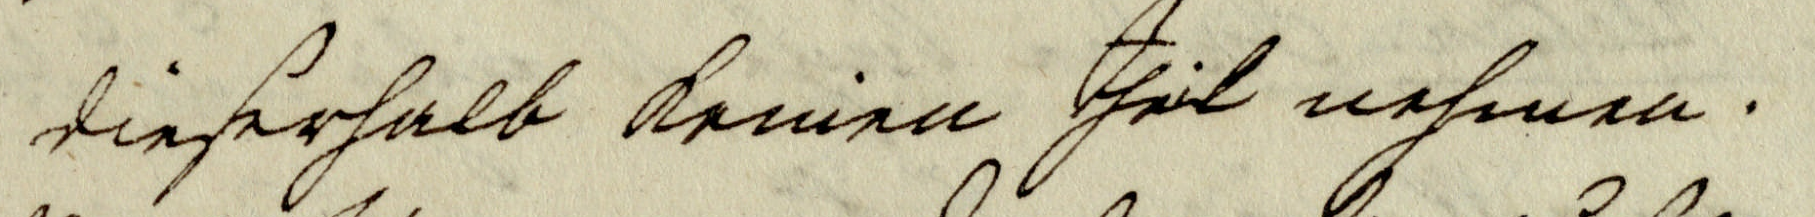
dieserhalb keinen Theil nehmen.
